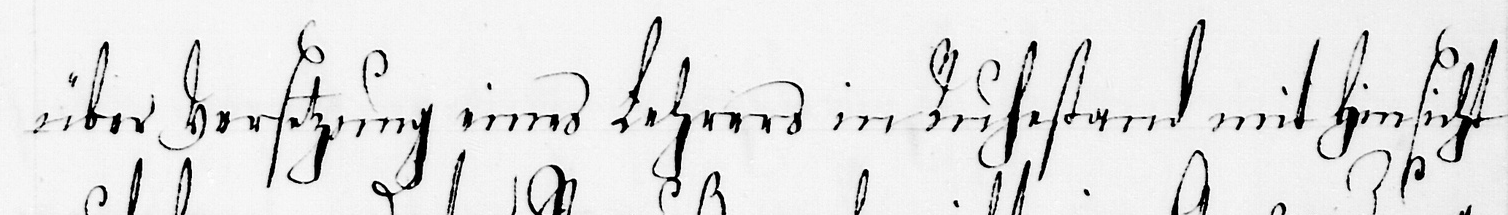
über Versetzung eines Lehrers in Ruhestand mit Hinsic¬
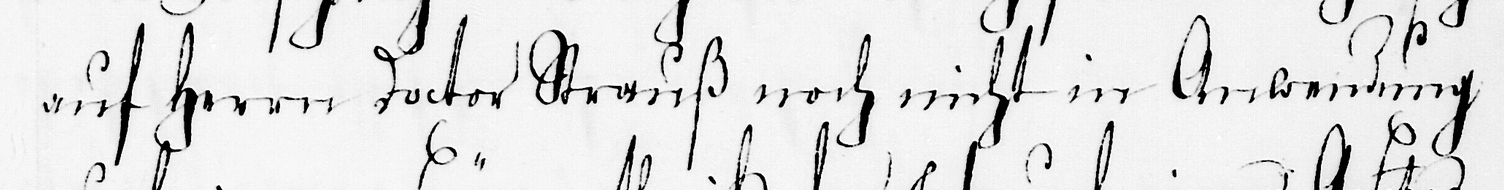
auf Herrn Doctor Strauß noch nicht in Anwendung
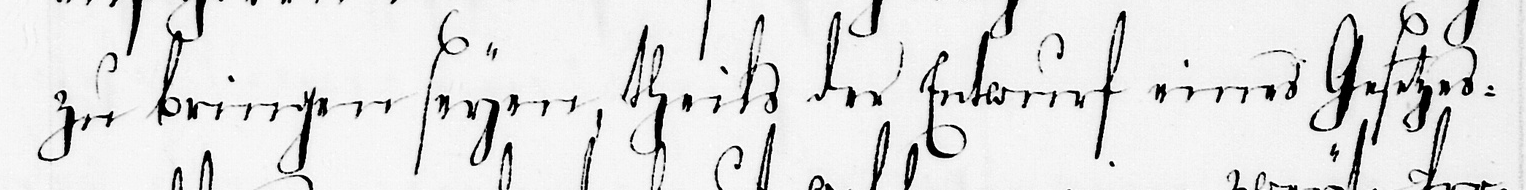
zu bringen seyen, theils der Entwurf eines Gesetzes¬
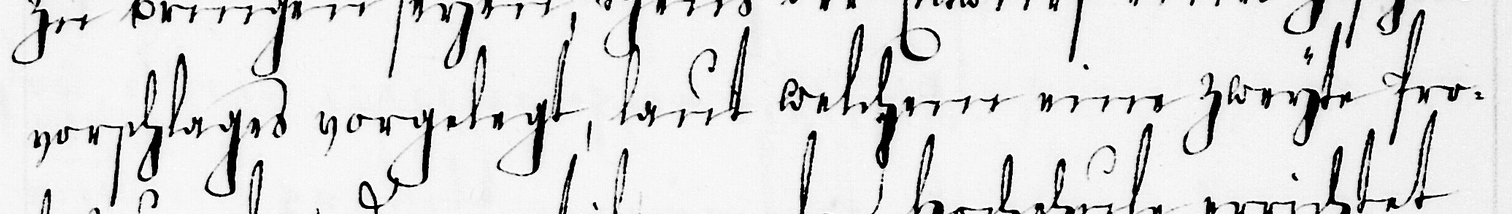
vorschlages vorgelegt, laut welchem eine zweyte Pro¬
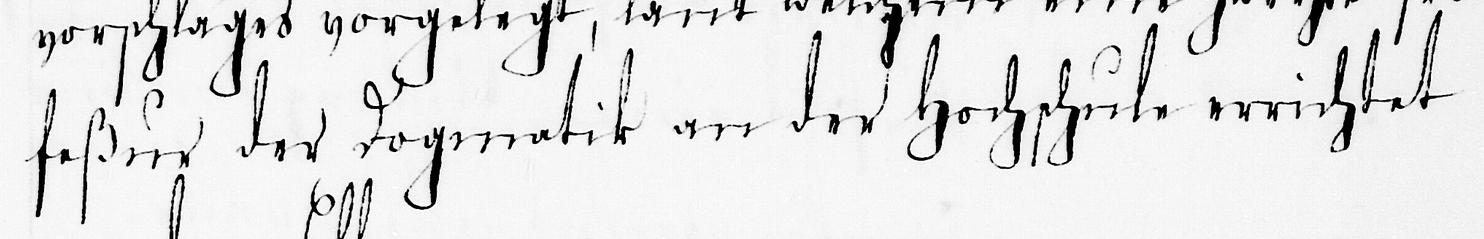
feßur der Dogmatik an der Hochschule errichtet
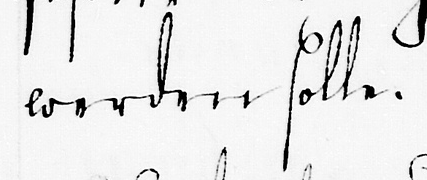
werden solle.
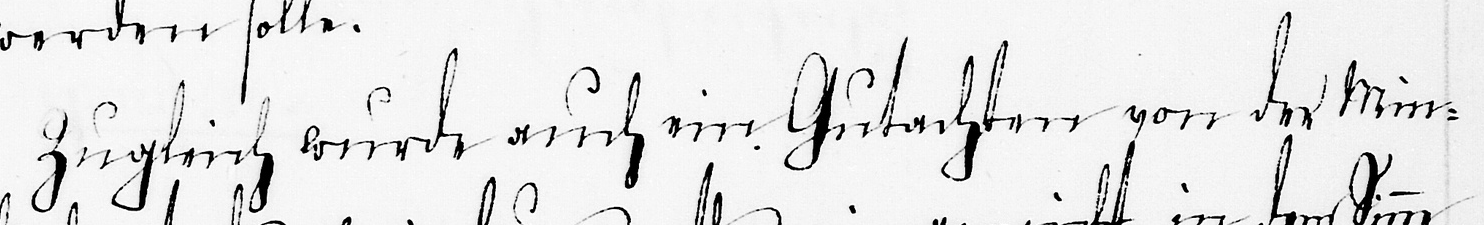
Zugleich wurde auch ein Gutachten von der Min¬
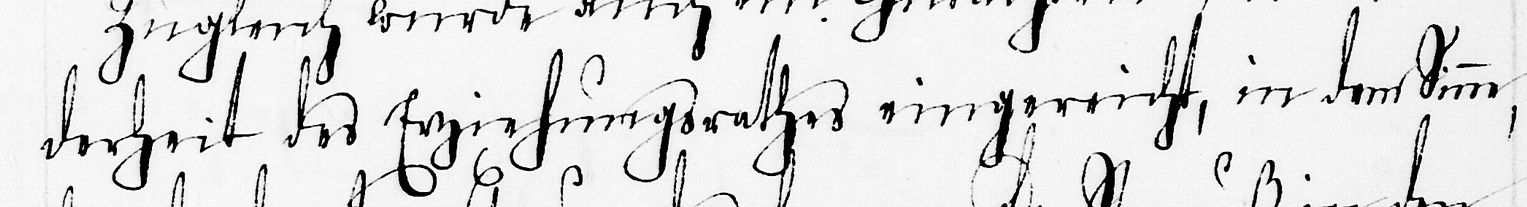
derheit des Erziehungsrathes eingereicht, in dem Sin¬
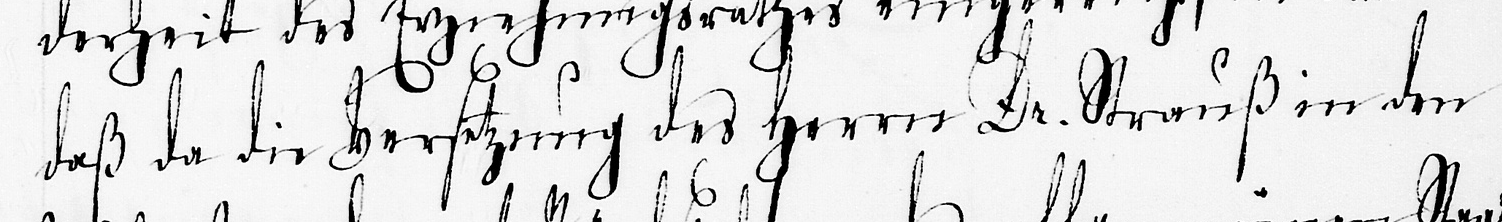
daß da die Versetzung des Herrn Dr. Strauß in den
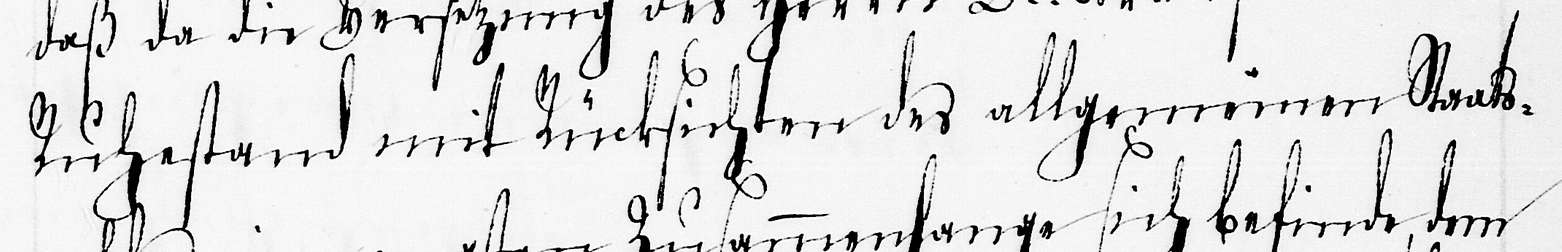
Ruhestand mit Rücksichten des allgemeinen Staat¬
